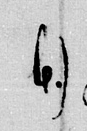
b.)
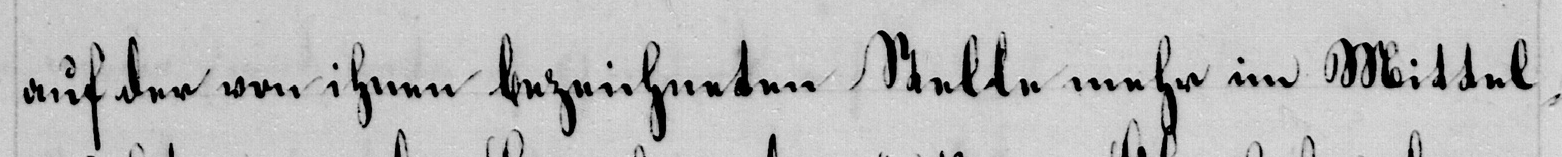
auf der von ihnen bezeichneten Stelle mehr im Mittel¬
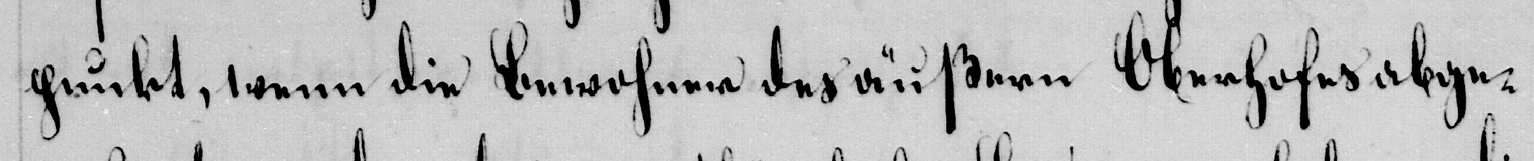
punkt, wenn die Bewohner des äußern Oberhofes abge¬
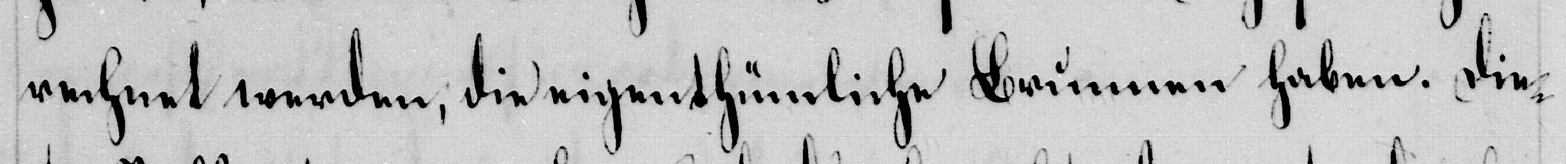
rechnet werden, die eigenthümliche Brunnen haben. Die¬
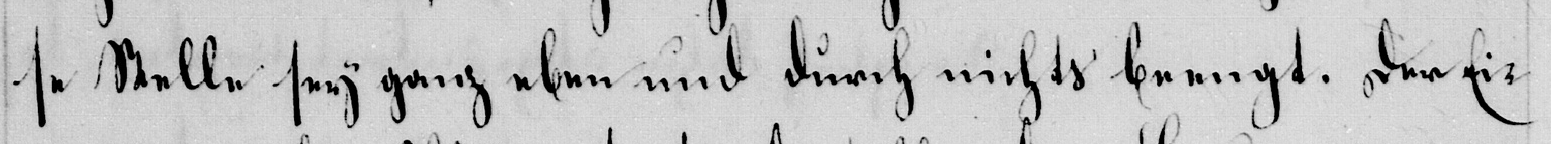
se Stelle sey ganz eben und durch nichts beengt. Der Ei¬
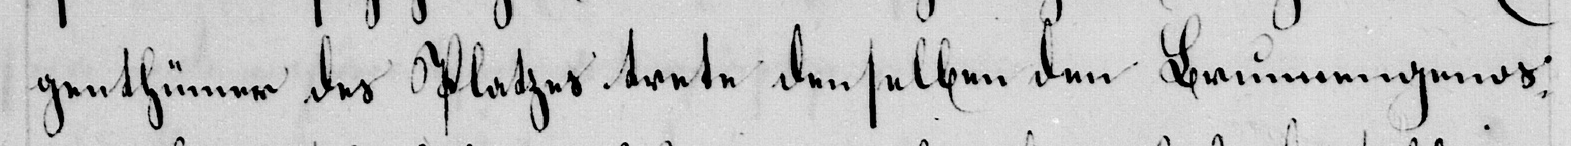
genthümer des Platzes trete denselben den Brunnengenoß¬
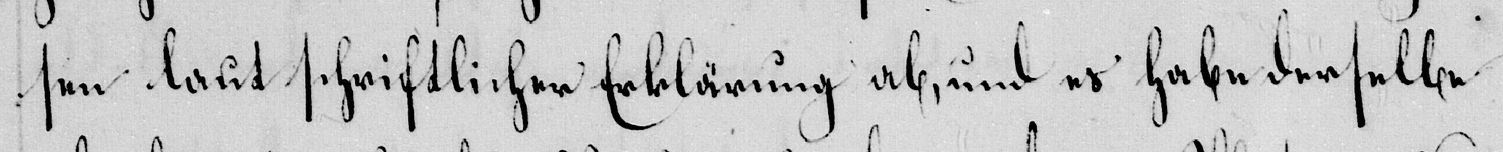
en laut schriftlicher Erklärung ab, und es habe derselbe
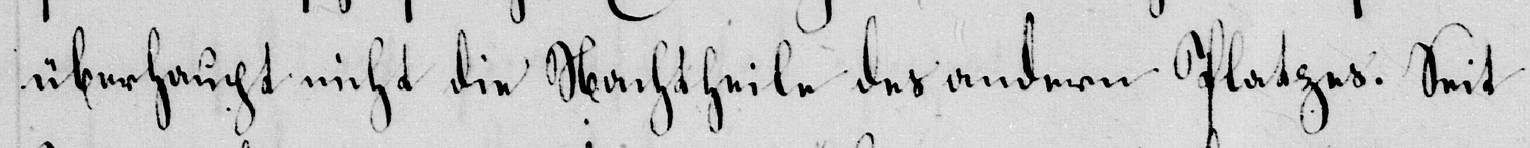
überhaupt nicht die Nachtheile des andern Platzes. Seit
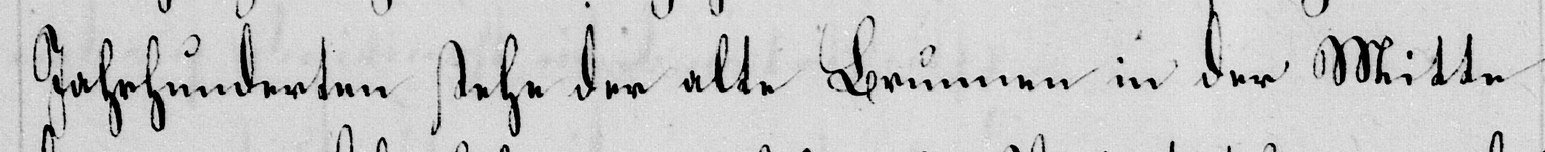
Jahrhunderten stehe der alte Brunnen in der Mitte
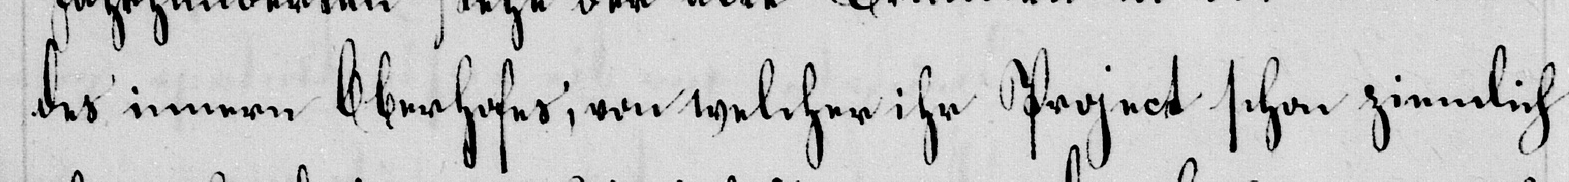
des innern Oberhofes, von welcher ihr Project schon ziemlich
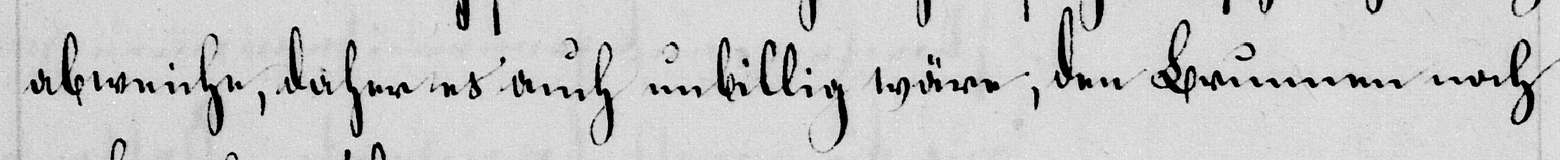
abweiche, daher es auch unbillig wäre, den Brunnen noch
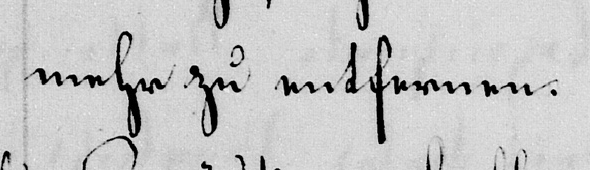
mehr zu entfernen.
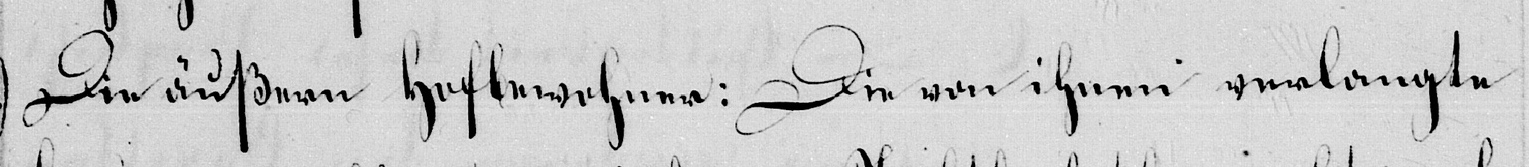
Die äußern Hofbewohner: Die von ihnen verlangte
